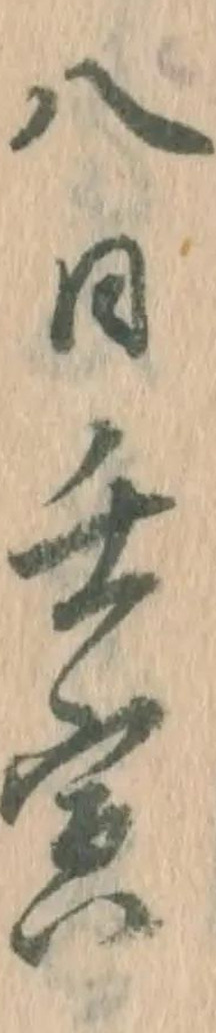八日壬寅
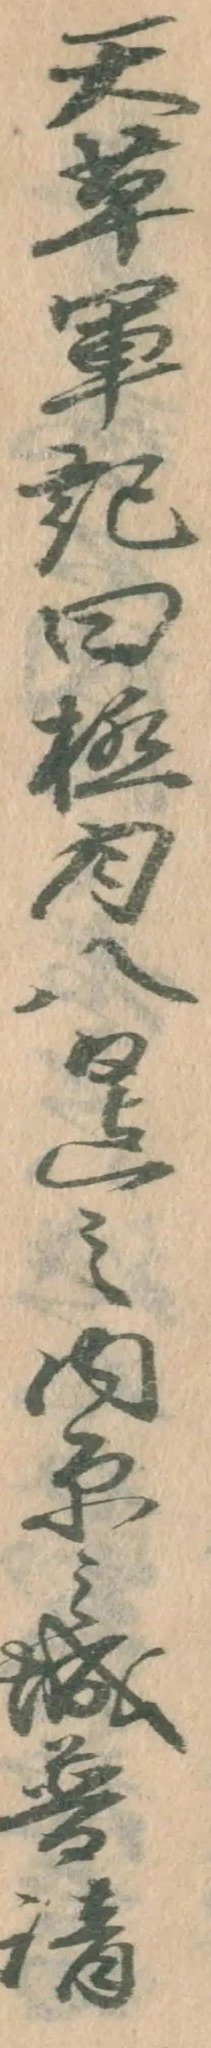天草軍記曰極月八日迄之内原之城普請
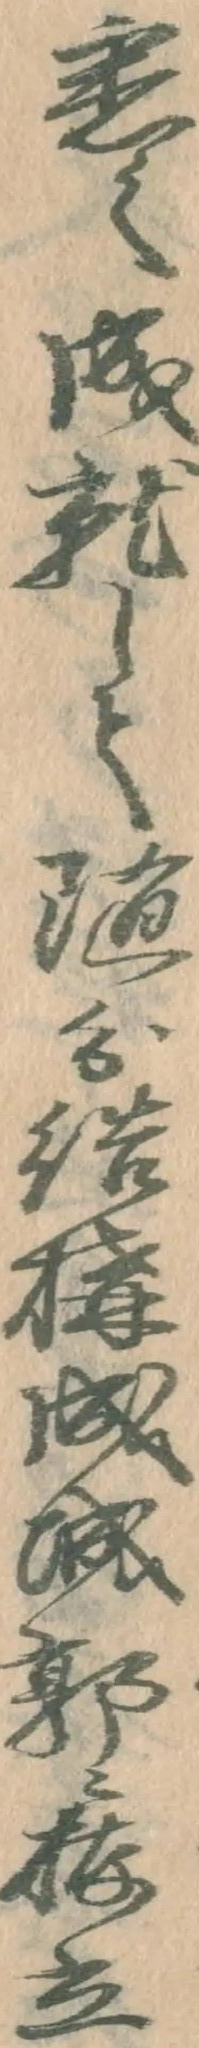悉く成就して随分結構成城郭に拵立
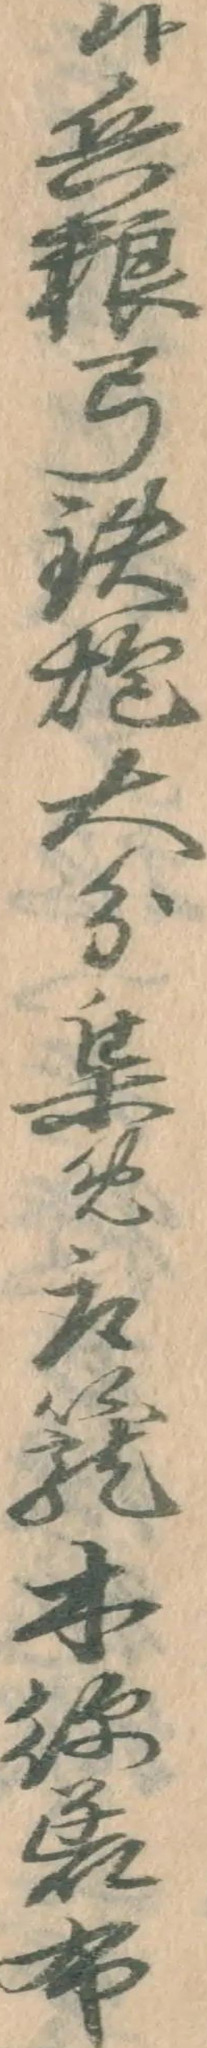候兵粮弓鉄炮大分集免取籠木綿差布

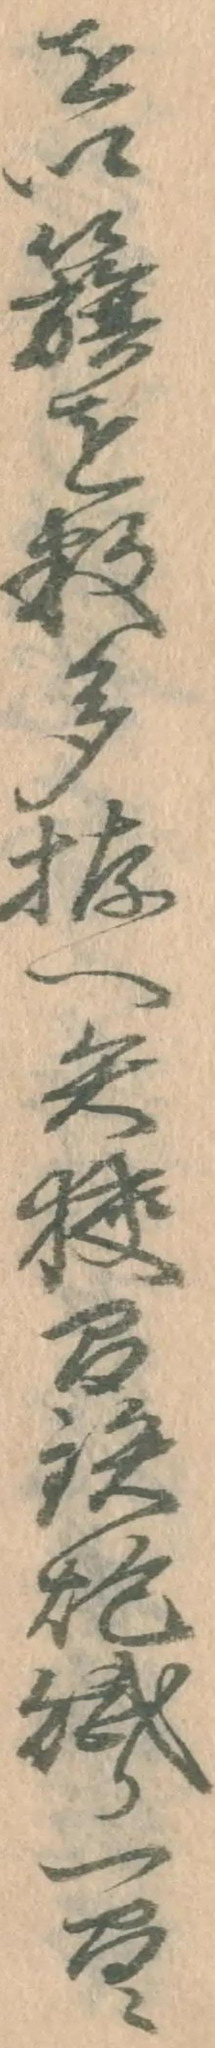を以籏を数多拵へ矢狭間鉄炮賊り一間に
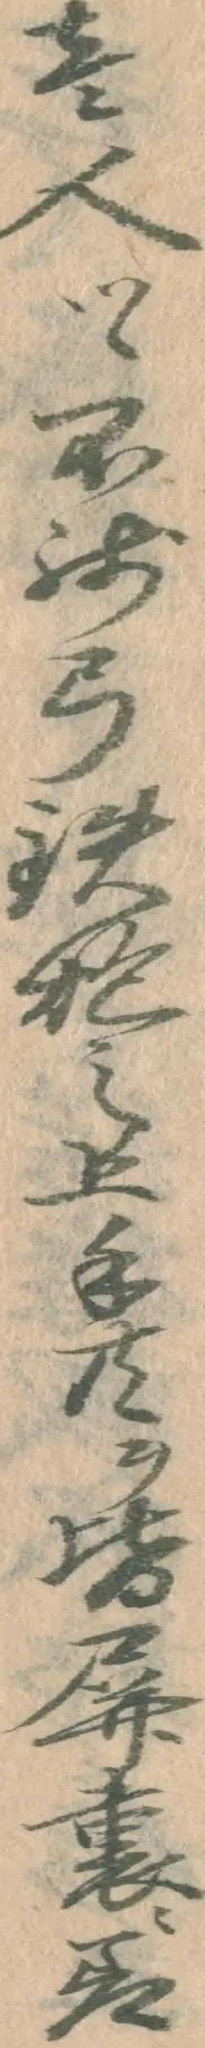壱人つゝ不残弓鉄炮之上手共を皆屏裏に差
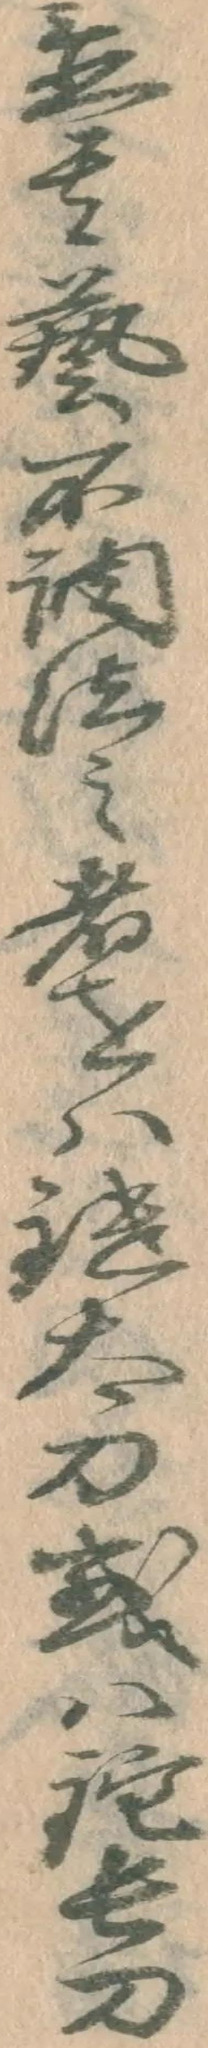置其藝不調法之者をは鎗太刀或は鉈長刀
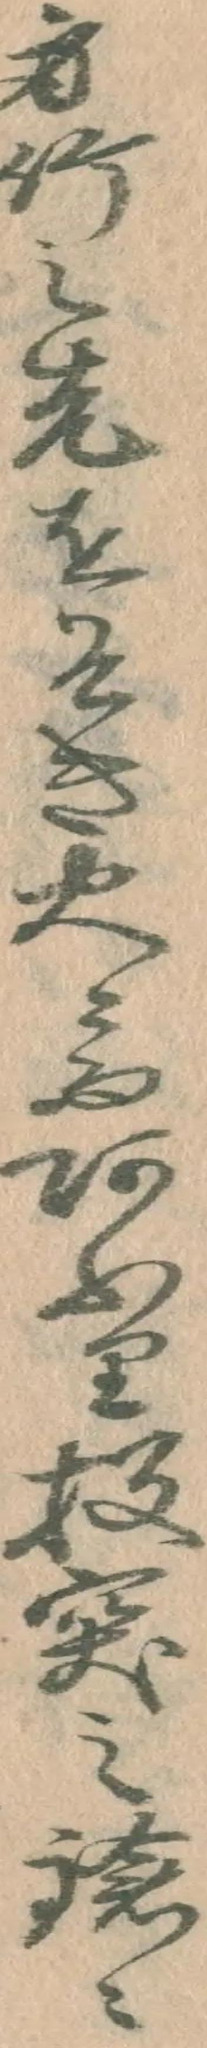方竹之先をそき火に而阿ふ里投突之鎗に
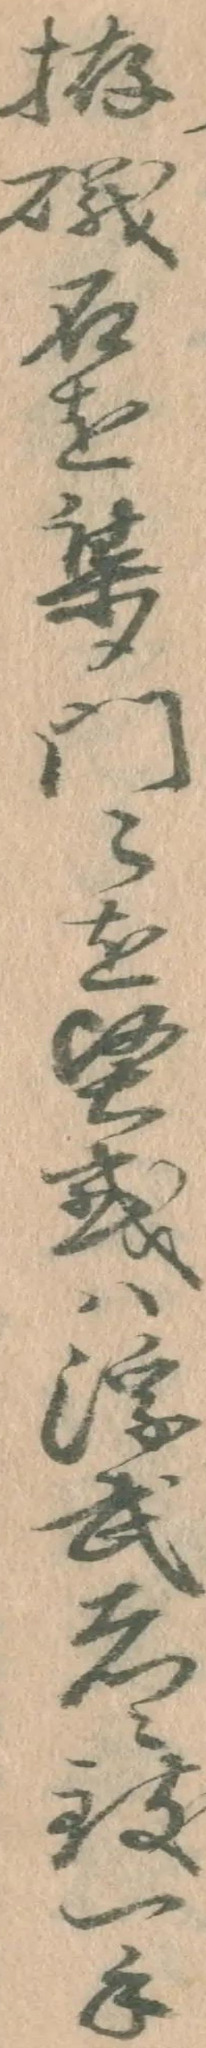拵磯石を集門々堅或は浮武者に致一手
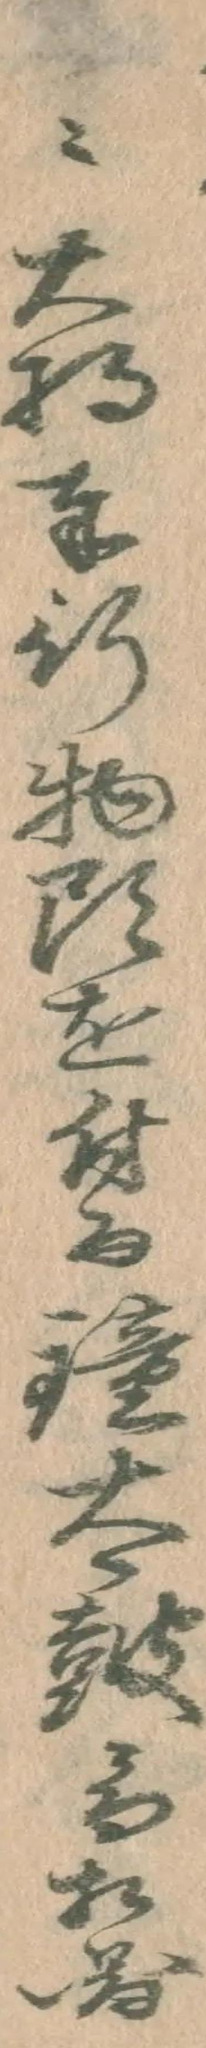に大将奉行物頭を付而鐘太鼓に而相図
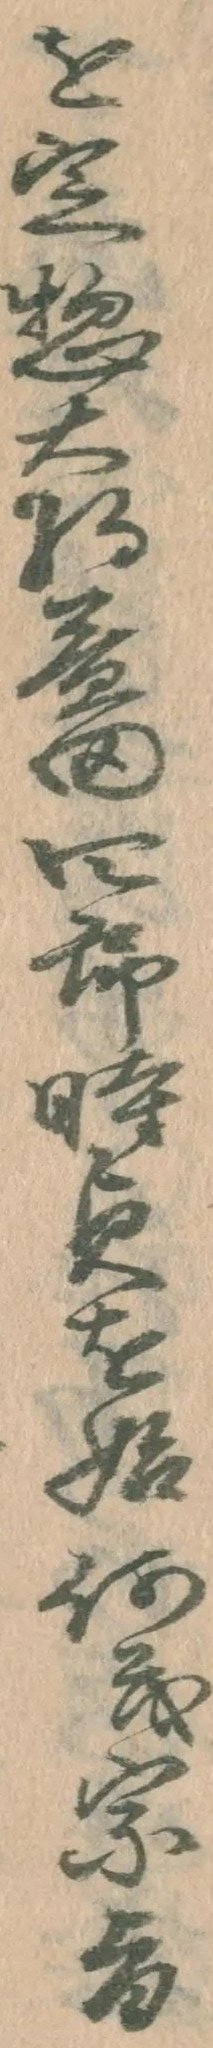を定惣大将益田四郎時貞を始何茂宗旨
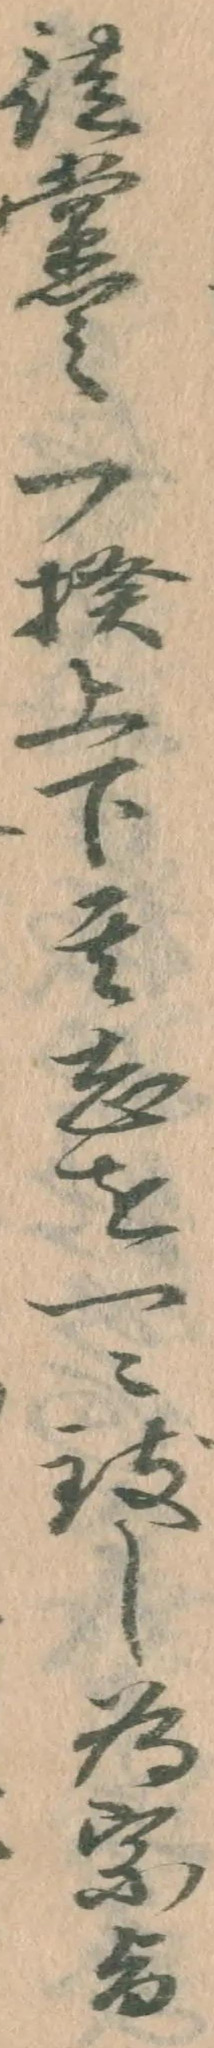徒党之一揆上下其志を一々致し為宗旨
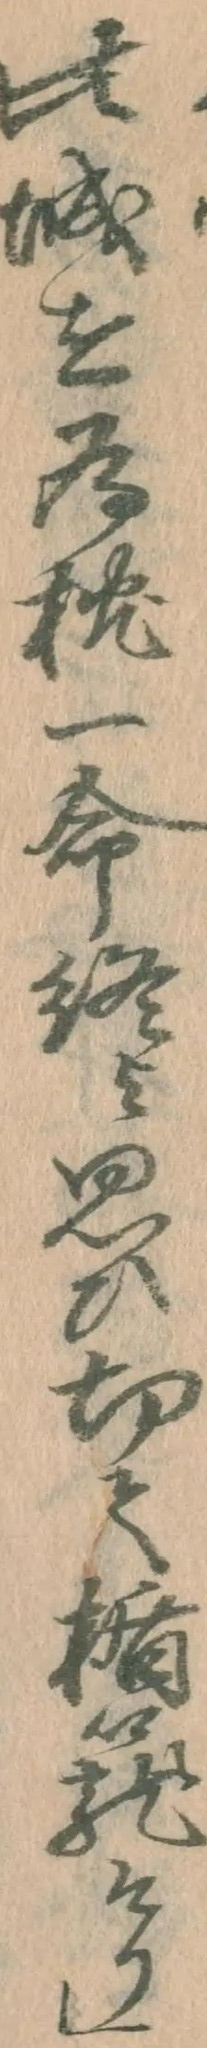此城を為枕一命終与思ひ切て楯籠けり
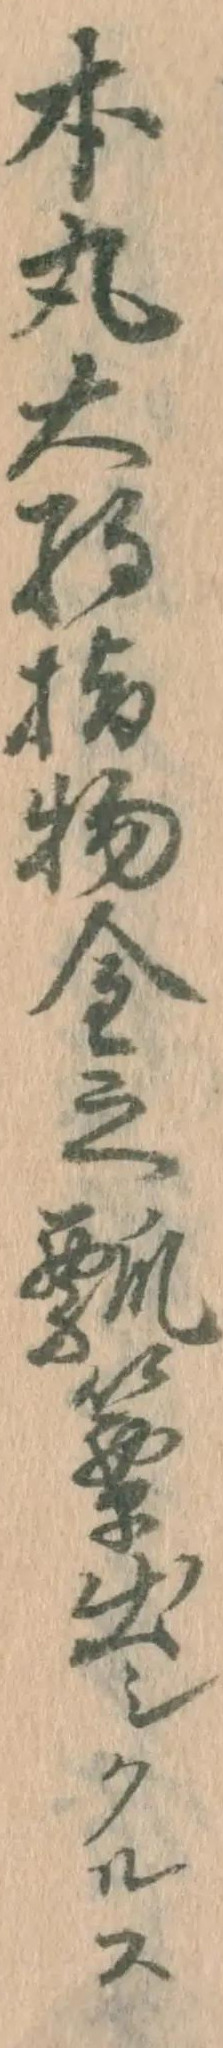本丸大将指物金之瓢箪出しクルス
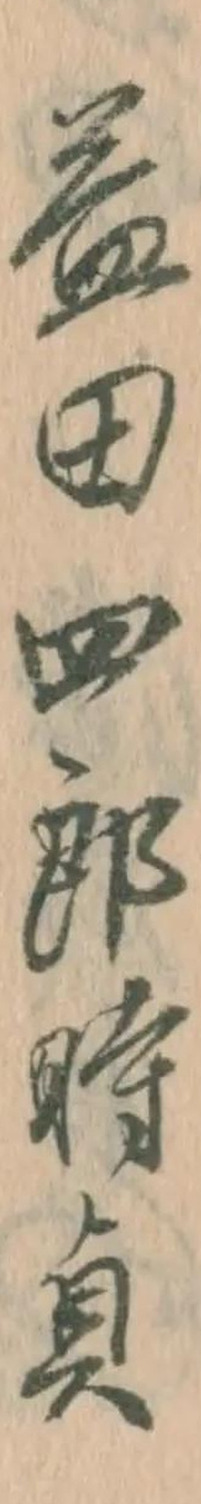益田四郎時貞
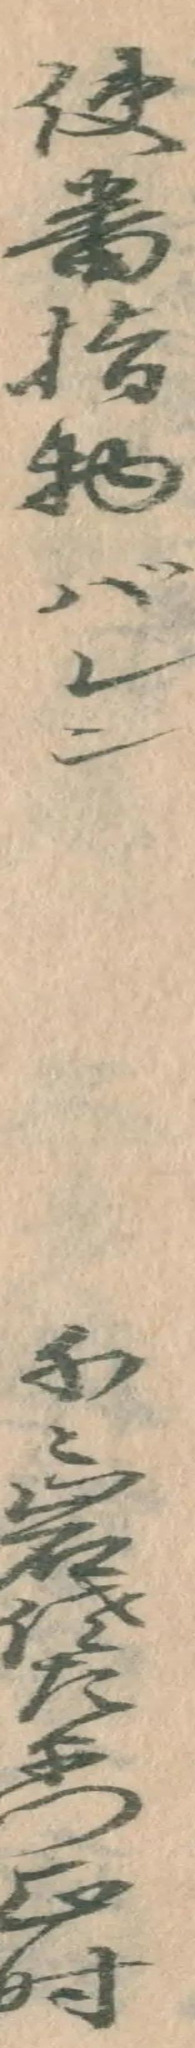使番指物ばれん千々岩佐左衛門正時
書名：切支丹御退治記 49巻. [4]
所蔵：国立国会図書館 National Diet Library, JAPAN
